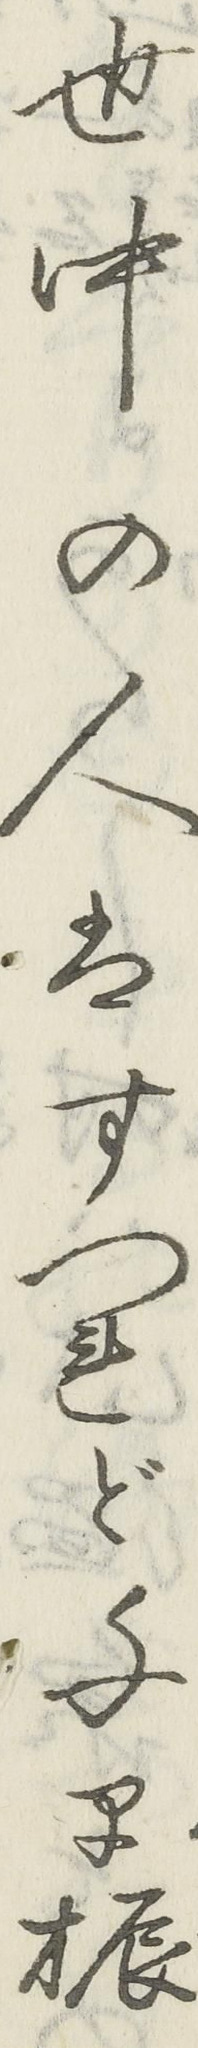世中の人はすつれど千早振
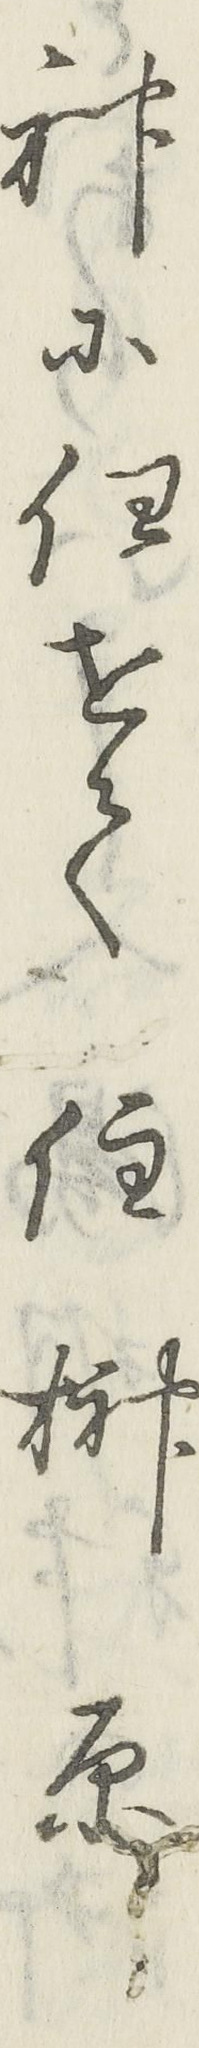神に任せて住榊原
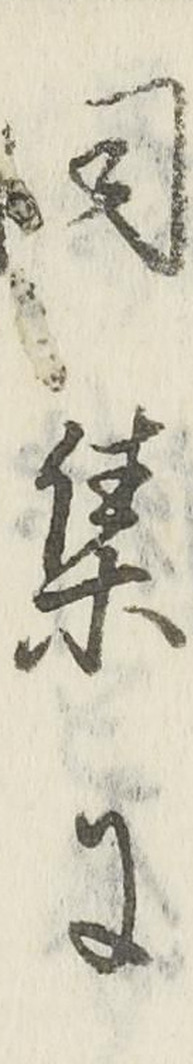同集に
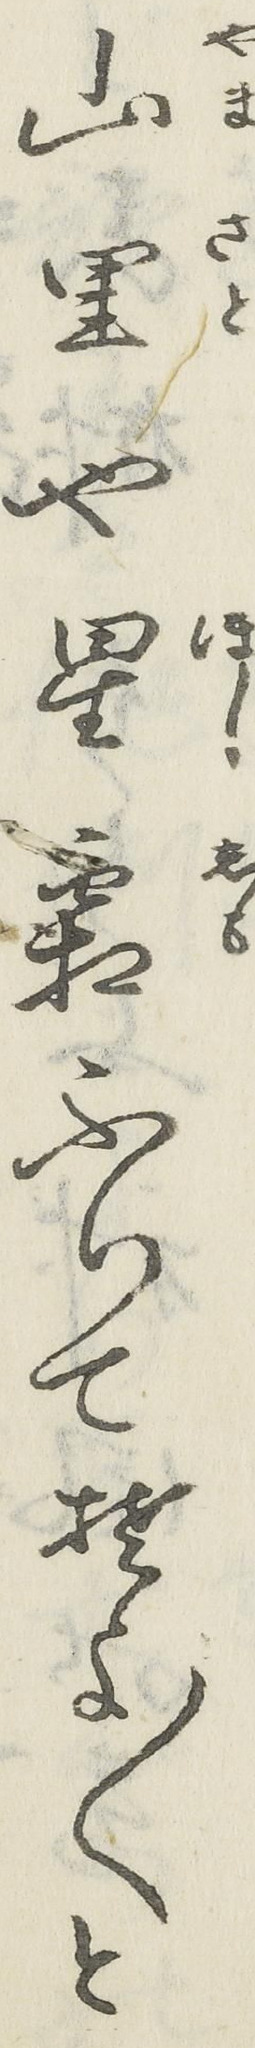山里や星霜ふりてそよ〱と

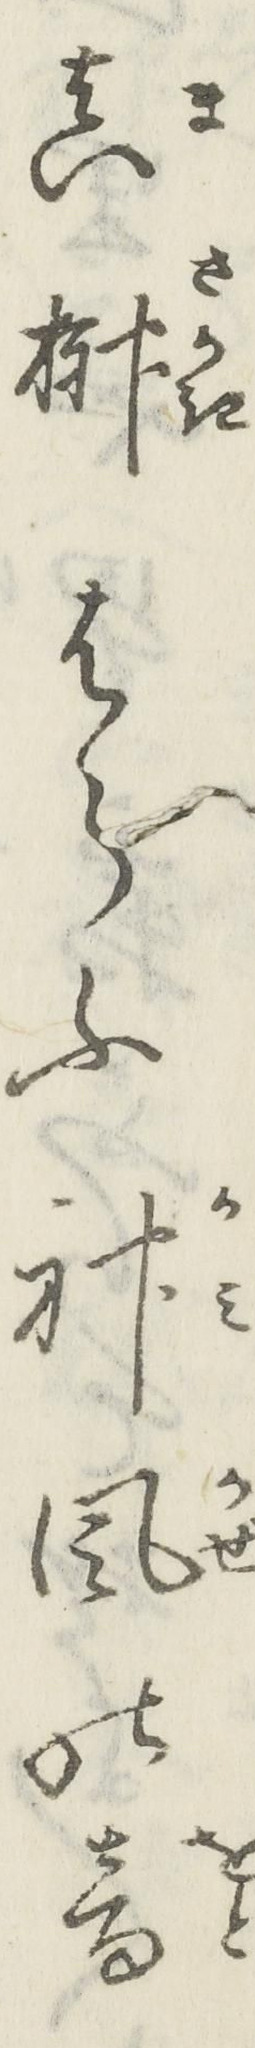真榊はらふ神風の音
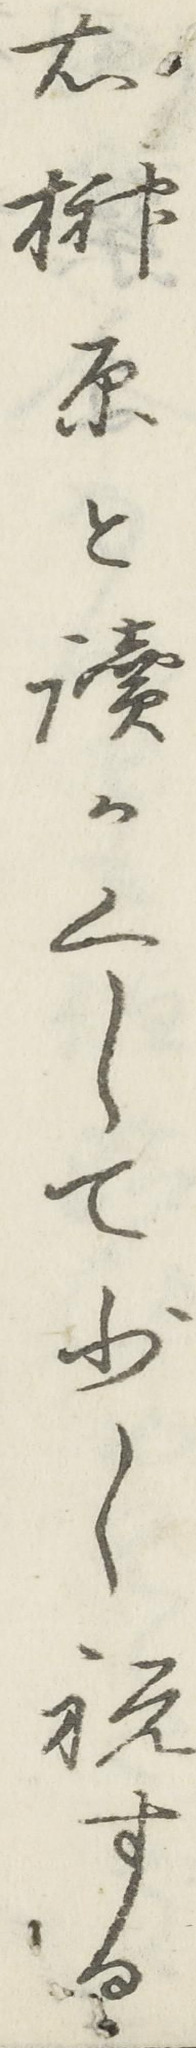右榊原と読かくして少し祝する
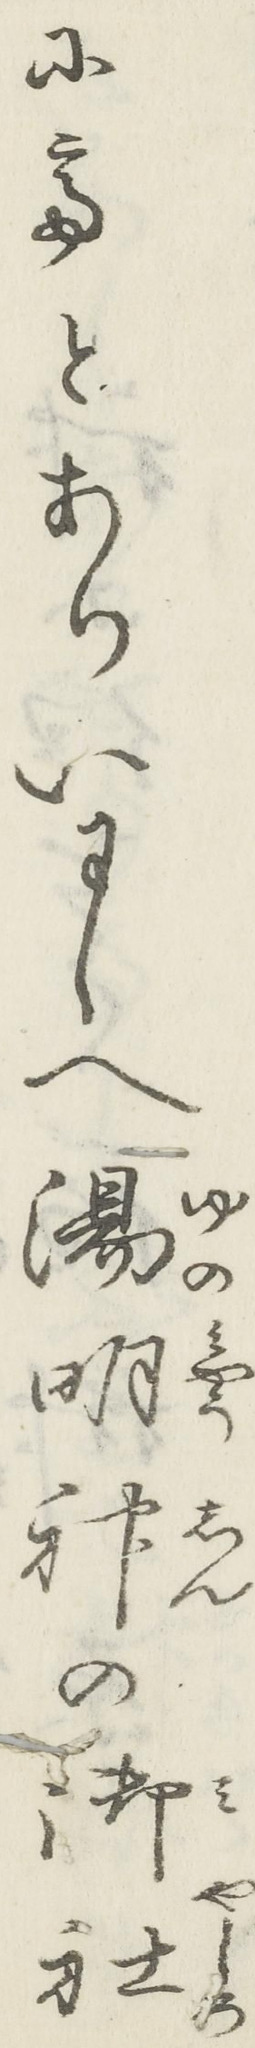にてとありいにしへ湯明神の御社
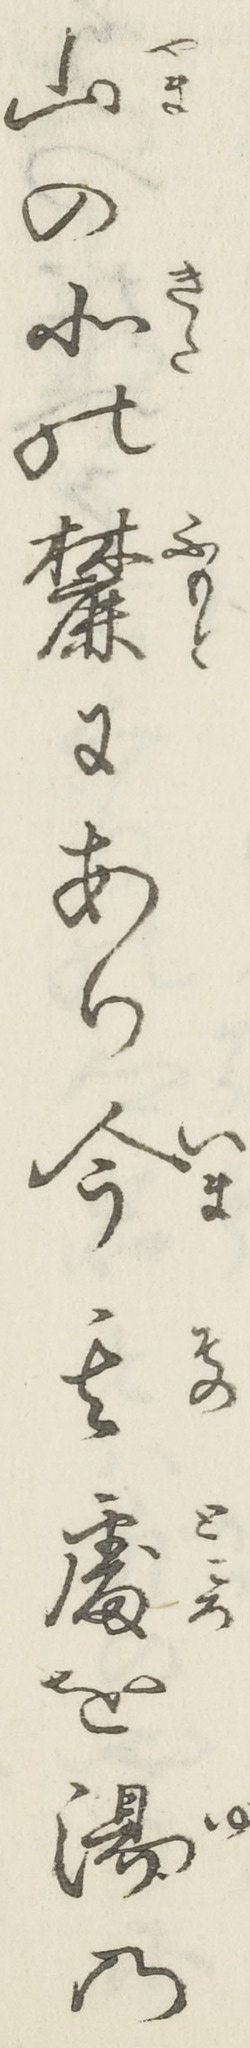山の北の麓にあり今其處を湯の
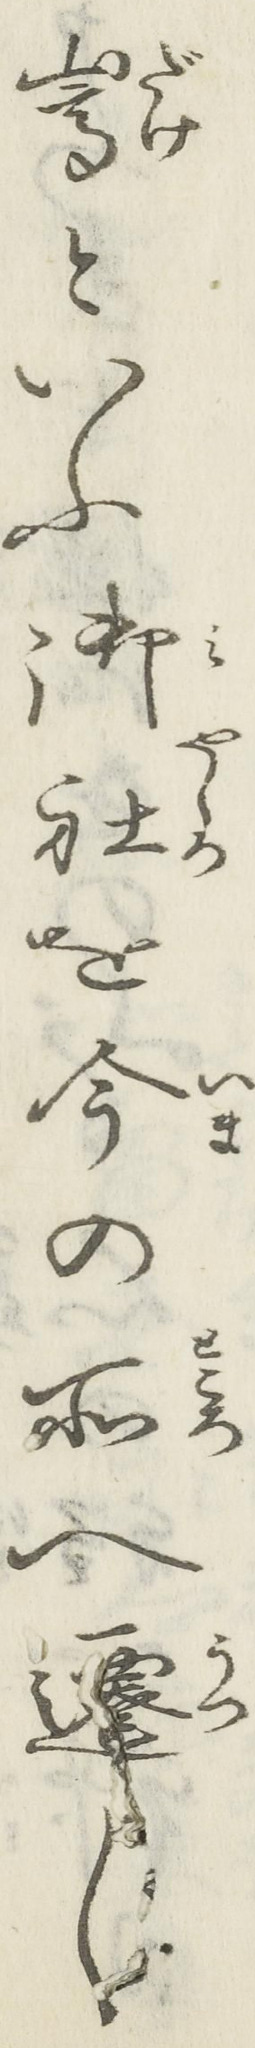嵩といふ御社を今の所へ遷し
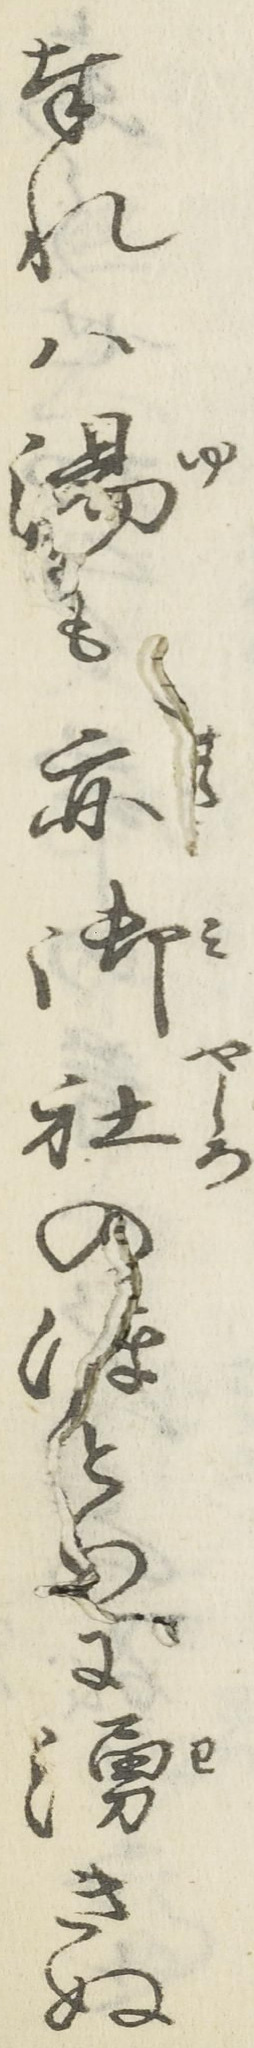奉れは湯も亦御社のほとりに湧きぬ
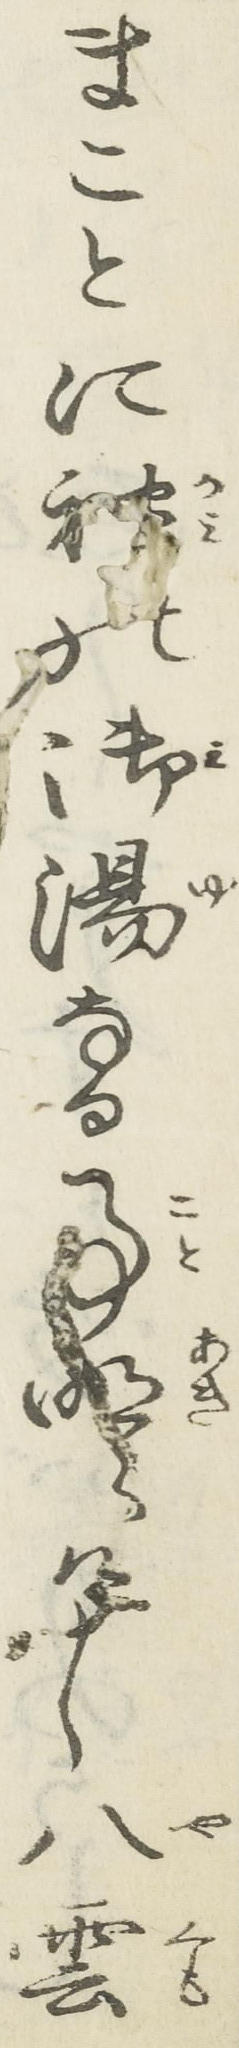まことに神の御湯なる事明らけし八雲
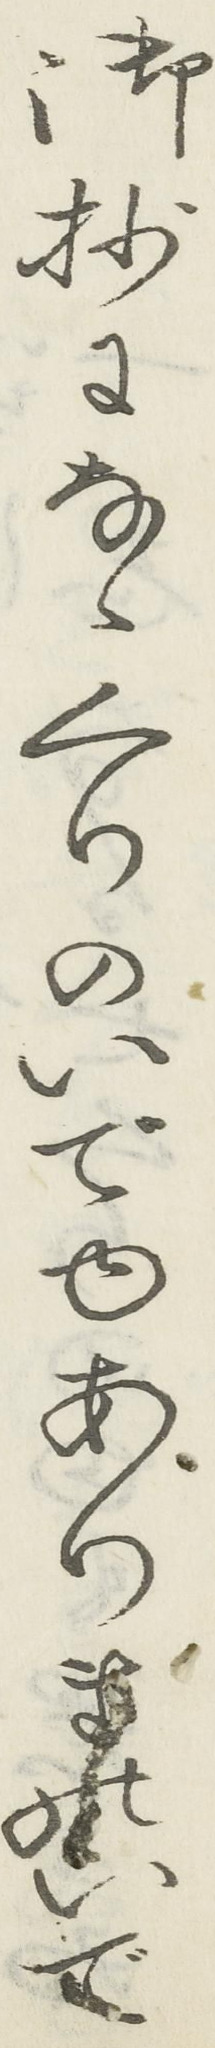御抄になゝくりのいでゆありまのいで
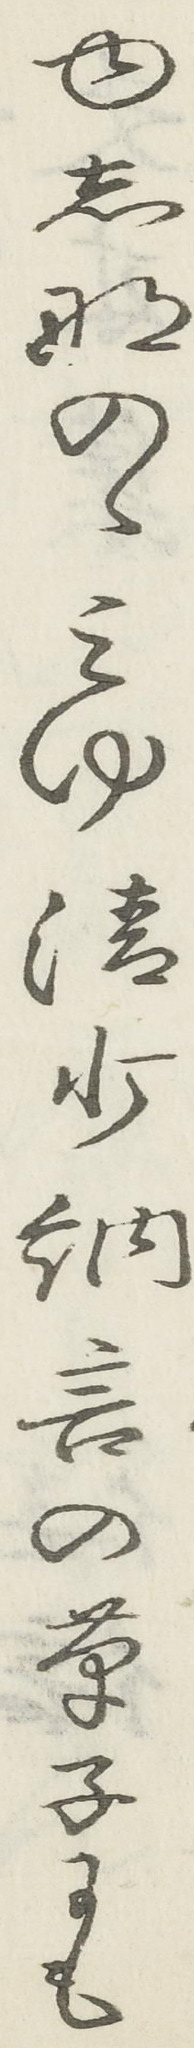ゆしなのゝみゆ清少納言の草子にも
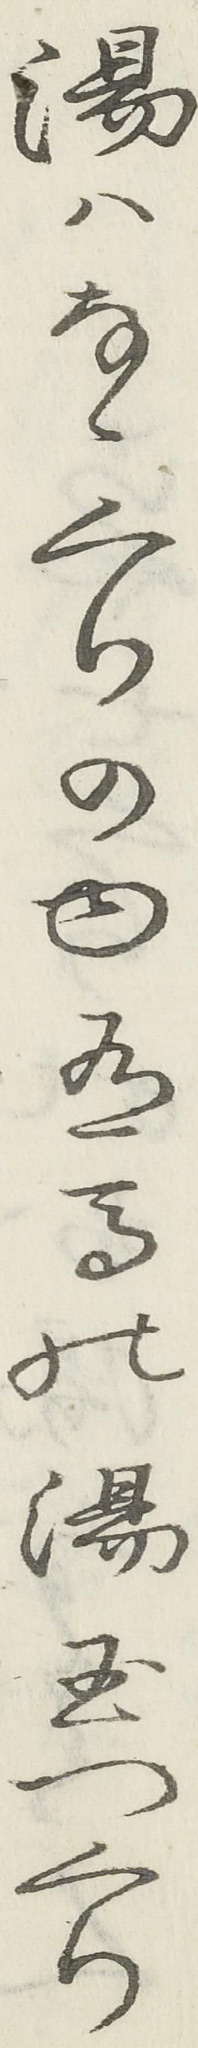湯はなゝくりのゆ有馬の湯玉つくり
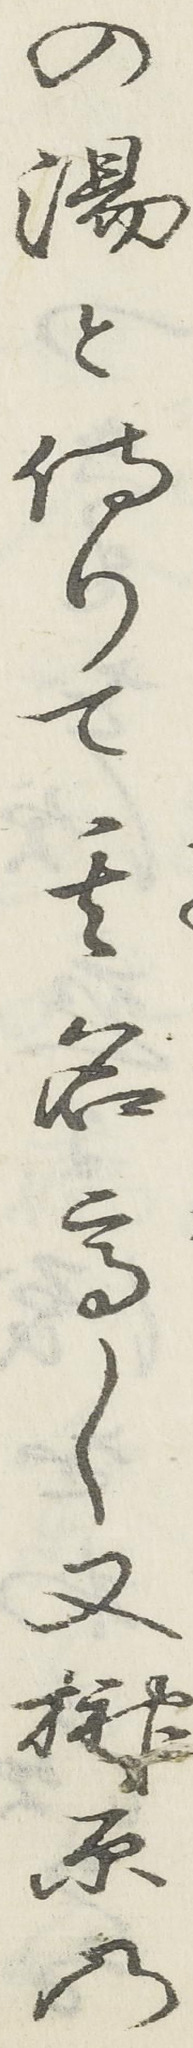の湯と侍りて其名高く又榊原の
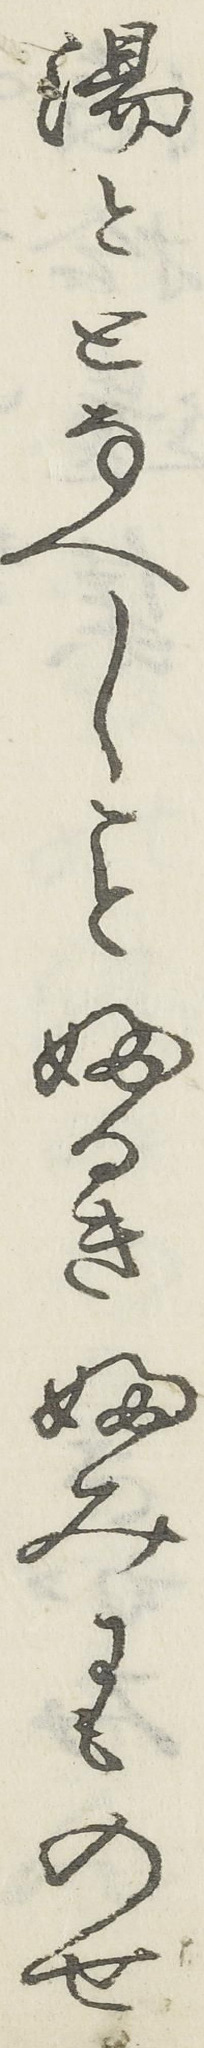湯ととなへしことふるきふみにものせ
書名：温泉来由記
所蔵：東京大学地震研究所図書室 Earthquake Research Institute Library, The University of Tokyo, JAPAN
